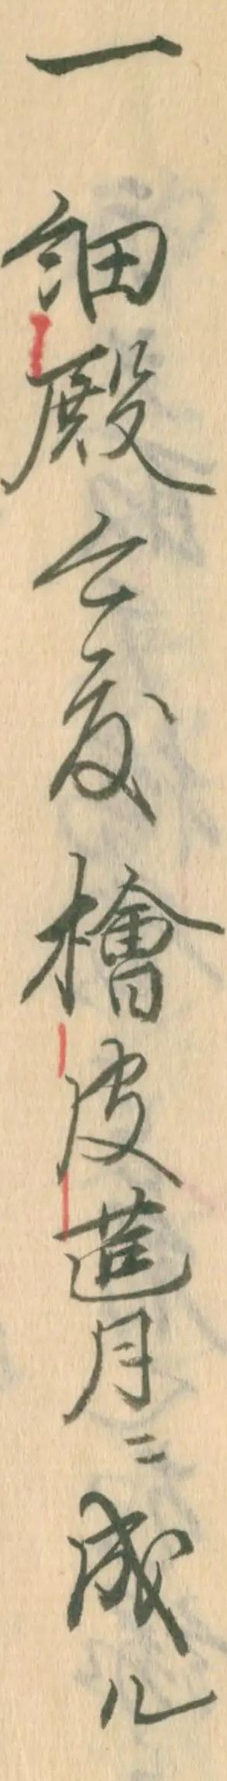一細_殿今度檜_葺ニ成ル
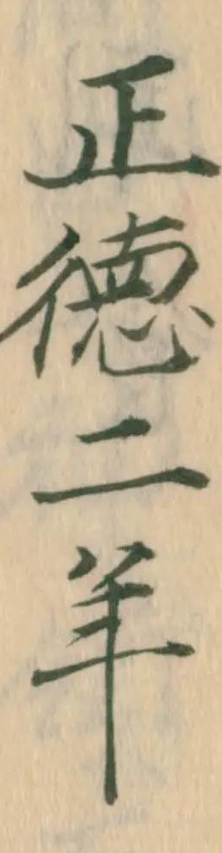正徳二年
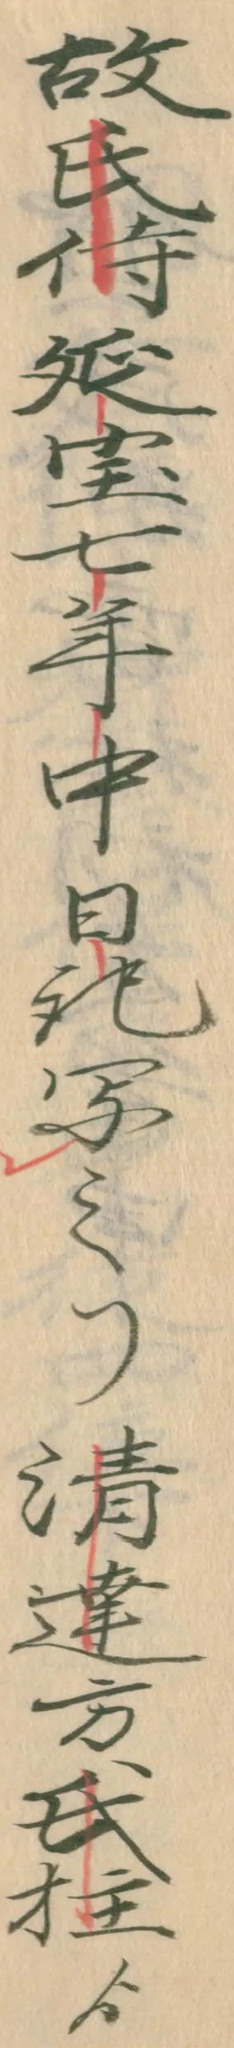故氏侍延-宝七-年-中日-記写之コト清達方氏柱ゟ
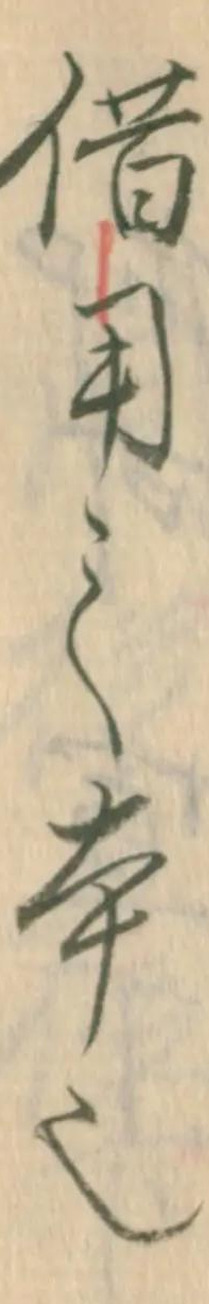借-用之本也
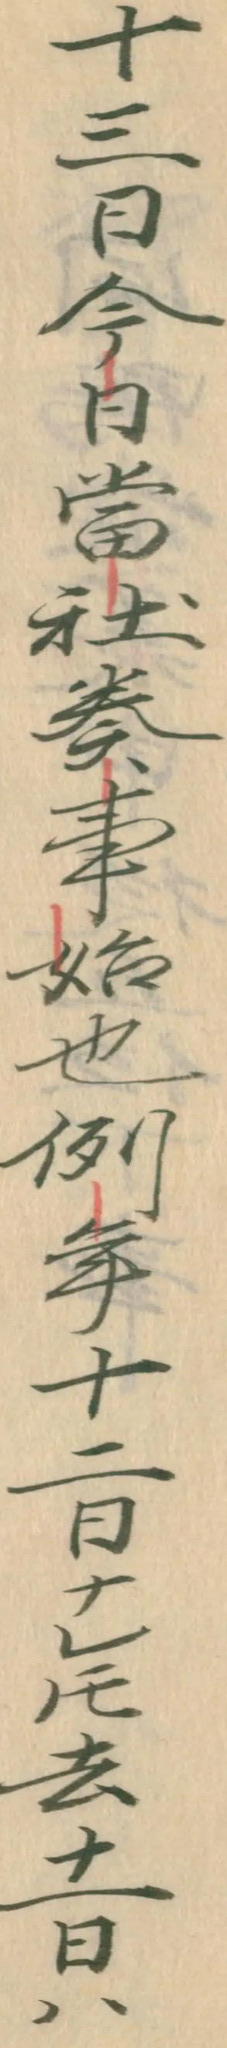十三日今-日当-社奏-事_始也例-年十二日ナレトモ去十一日ハ
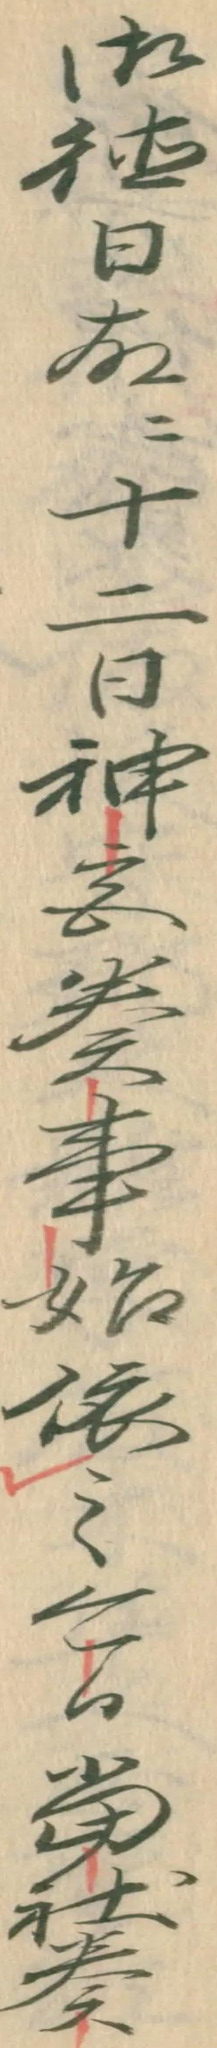御徳日故ニ十二日神-宮奏-事_始依之今-日当-社奏-
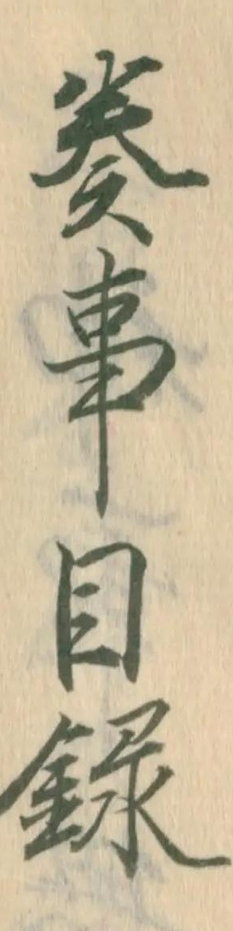奏事目録
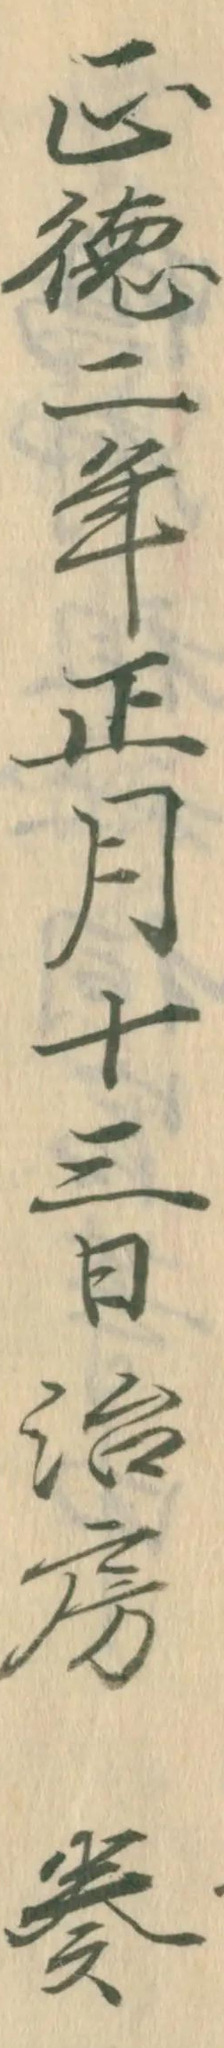正徳二年正月十三日治房奏

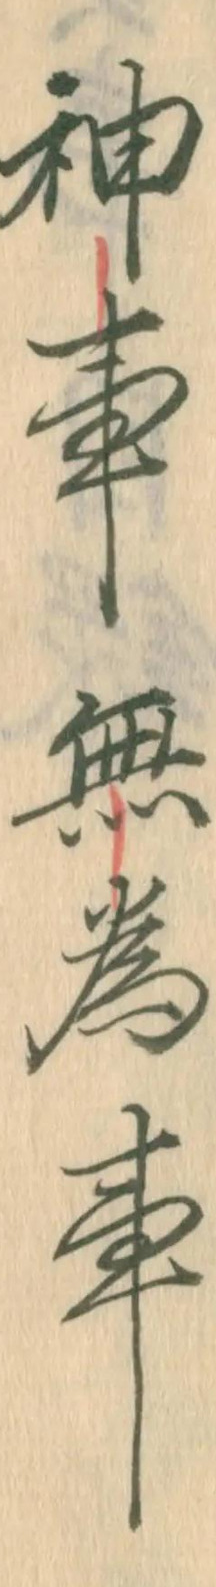神-事無-為事
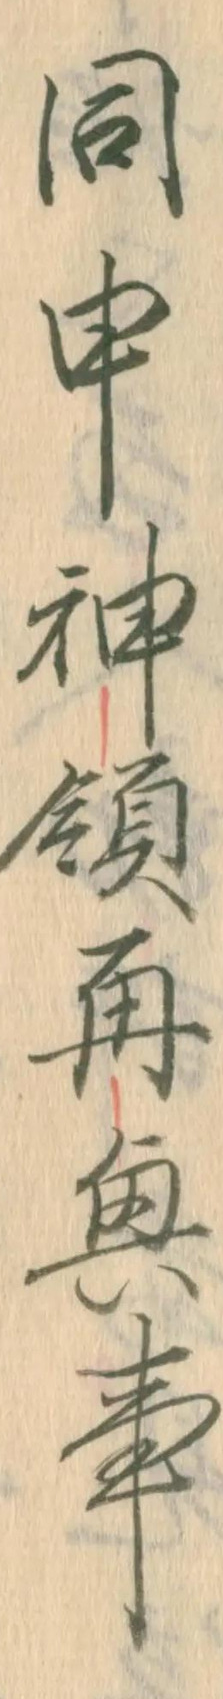同申神-領再-興事
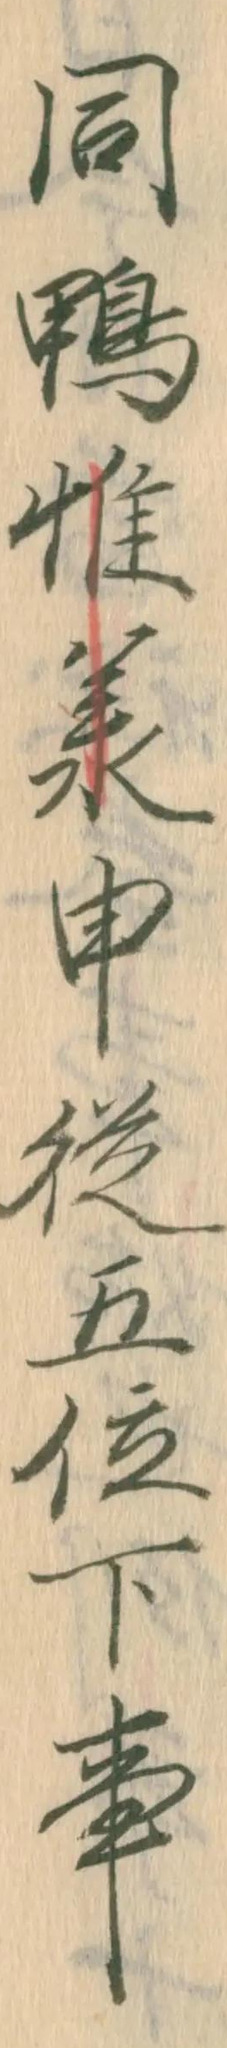同鴨惟承申従五位下事
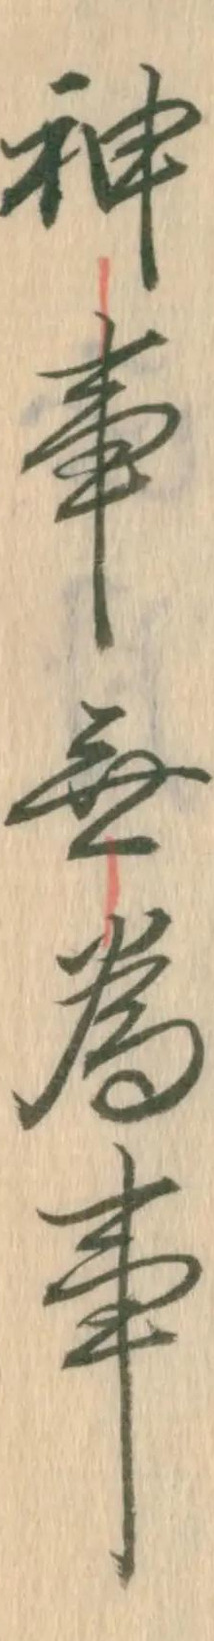神-事無-為事
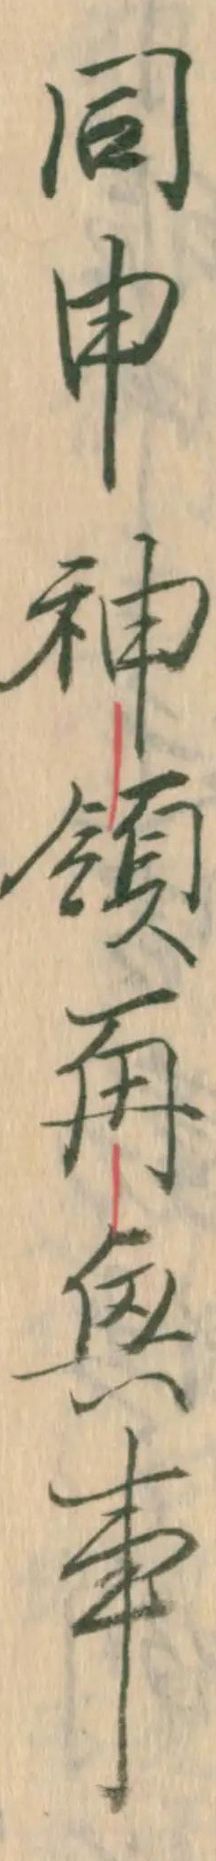同申神-領再-興事
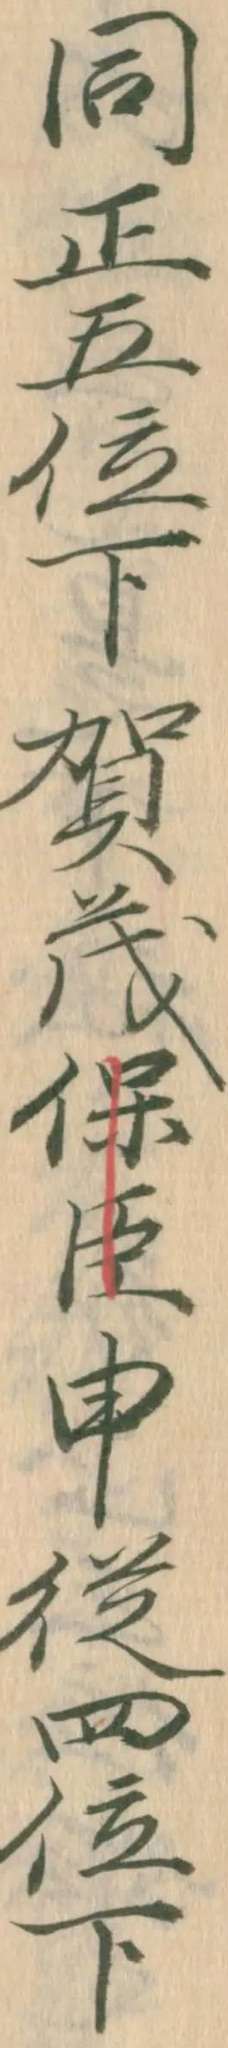同正五位下賀茂保臣申従四位下
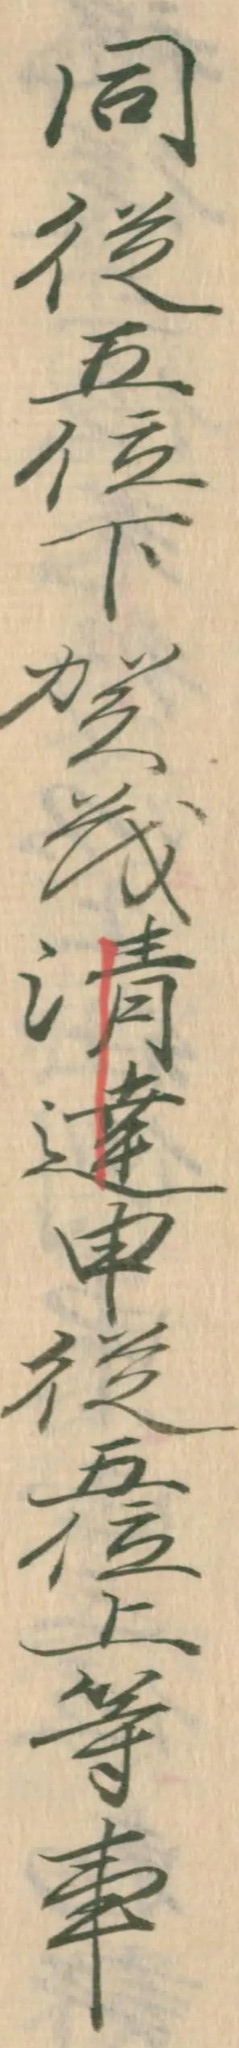同従五位下賀茂清達申従五位上等事
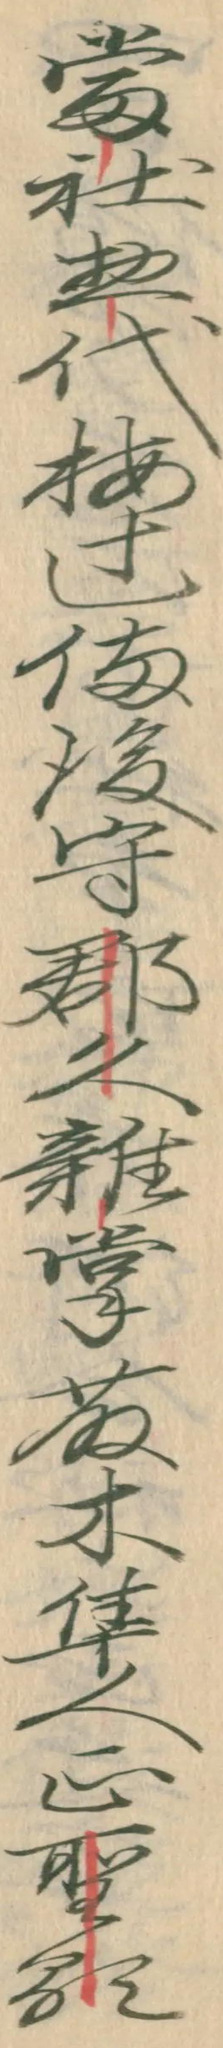当-社惣-代梅辻備後守郡久雑-掌藤木隼人正聖顕
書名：賀茂社記録. 第16冊
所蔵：国立国会図書館 National Diet Library, JAPAN
